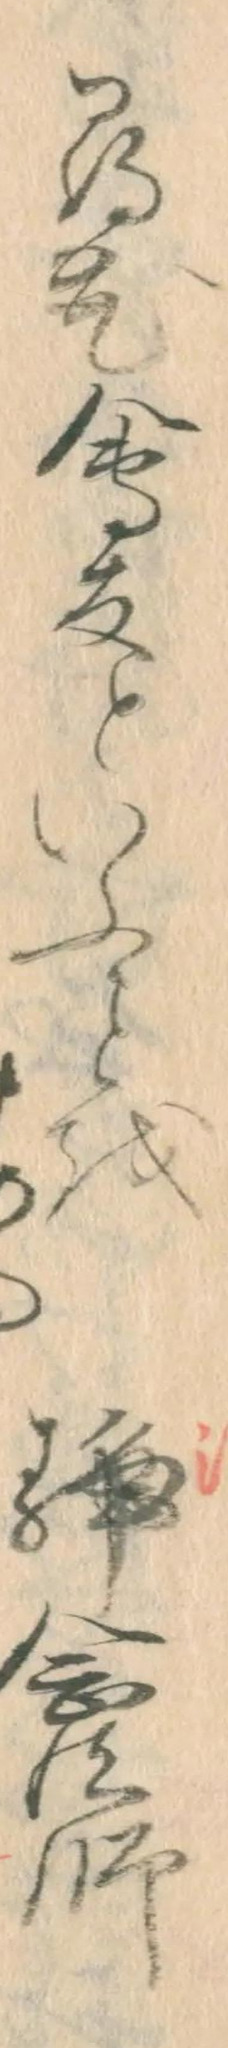尋花会友といふことを静念法師
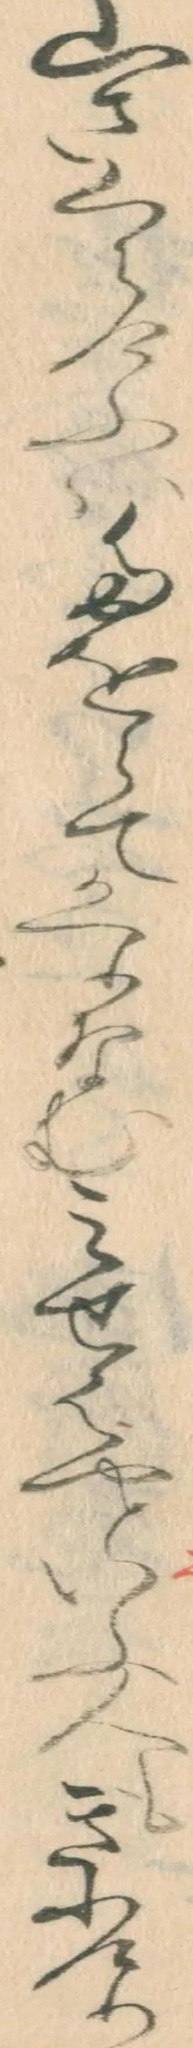山さくらけふはたをらてかへりなむみせはやといふ人もきにけり
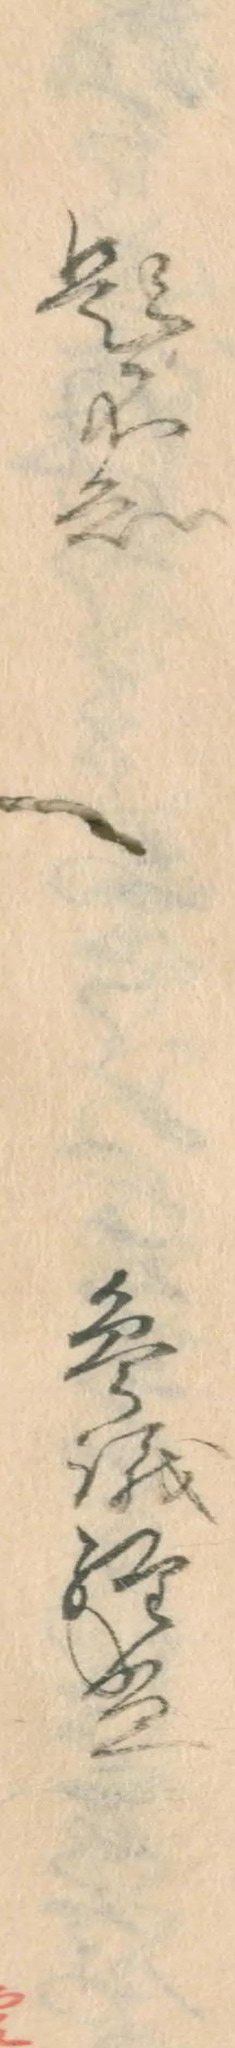題不知参議経盛
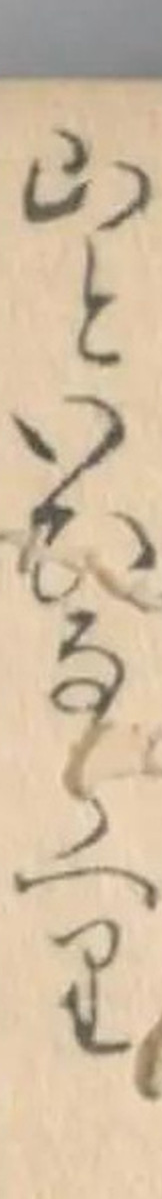山といひならへり
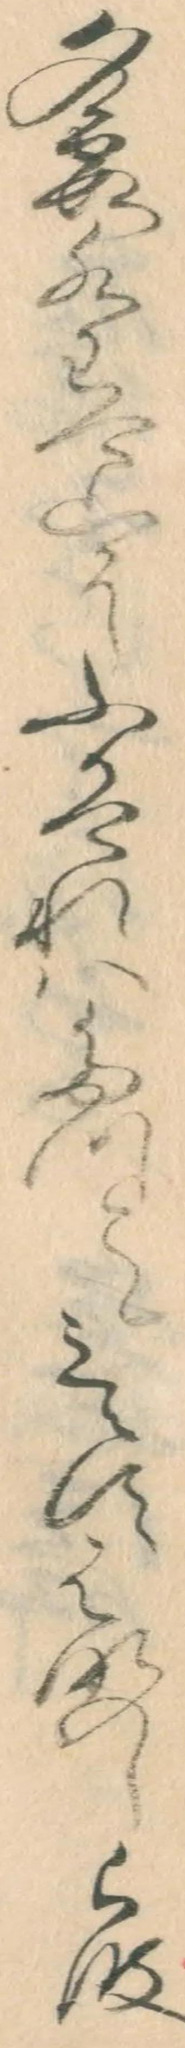夕霞水わけ山にふかけれはたつともみえすはなのしら波

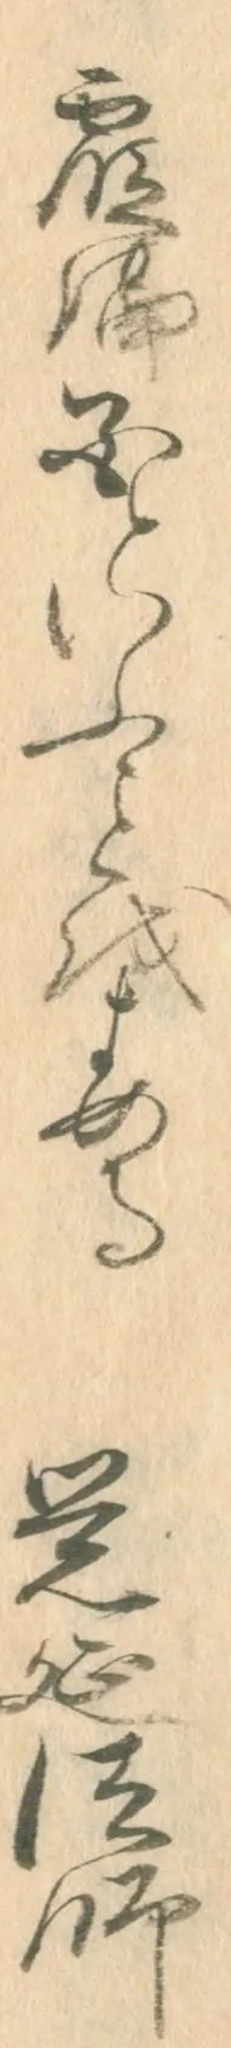霞隔花といふことをよめる覚延法師
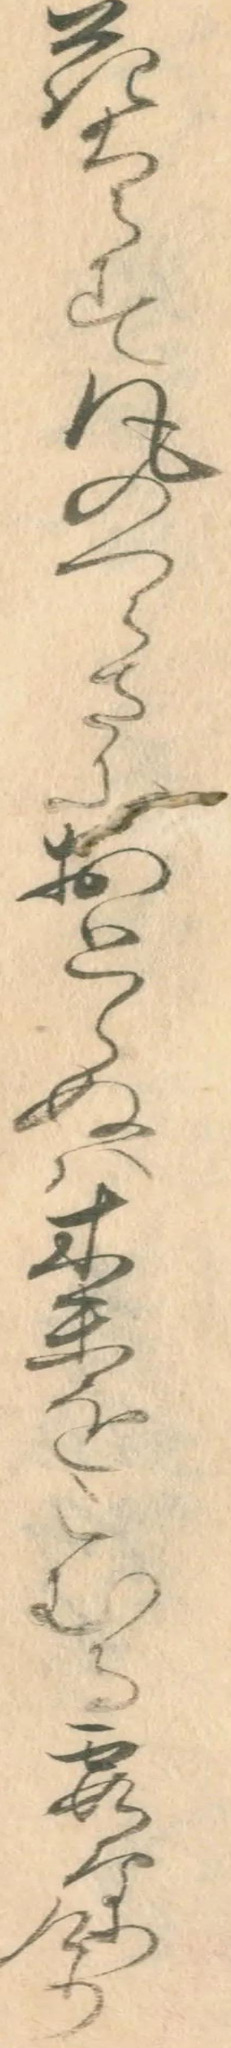花ちらす風のつらさにおとらぬは木末をこむる霞なりけり
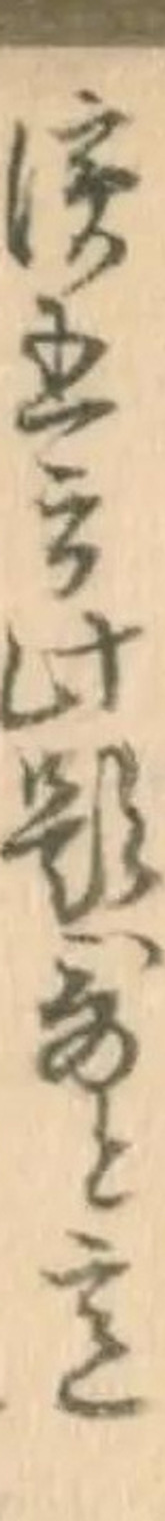浜臣云此題歌と意
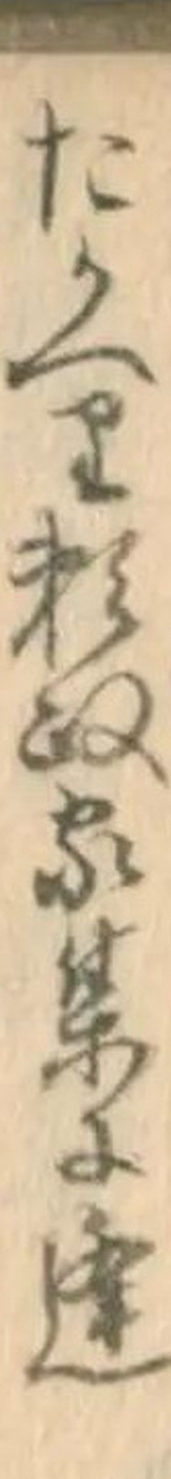たかへり頼政家集に逢
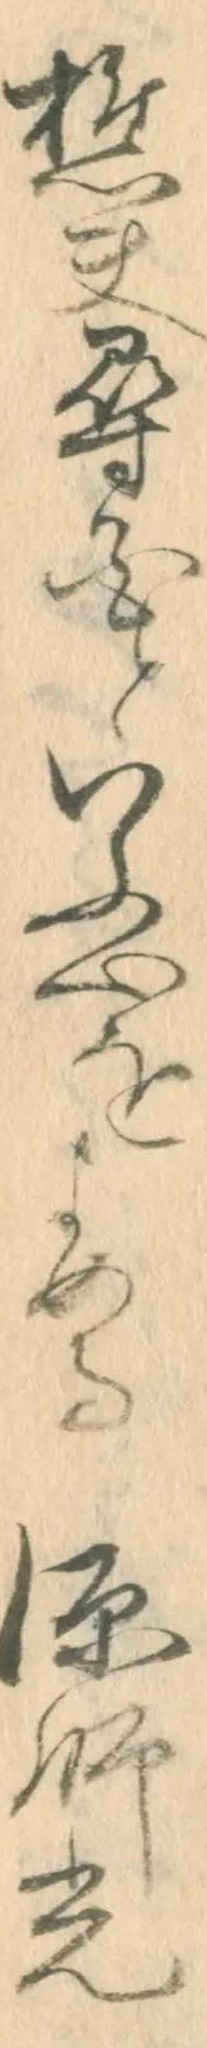樵夫尋花といふ心をよめる源師光
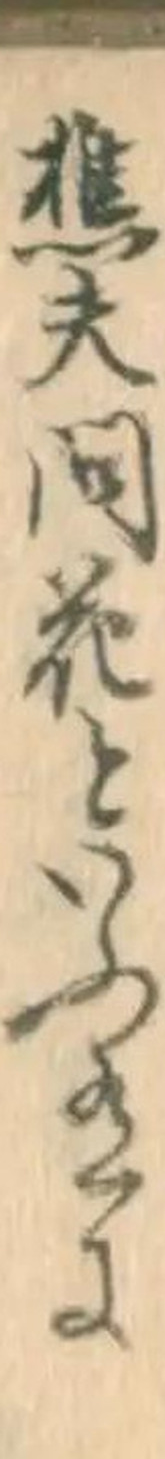樵夫問花といふ有に
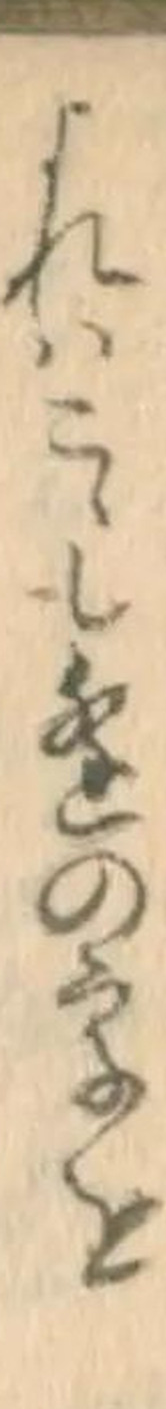よれはこゝも逢の字を
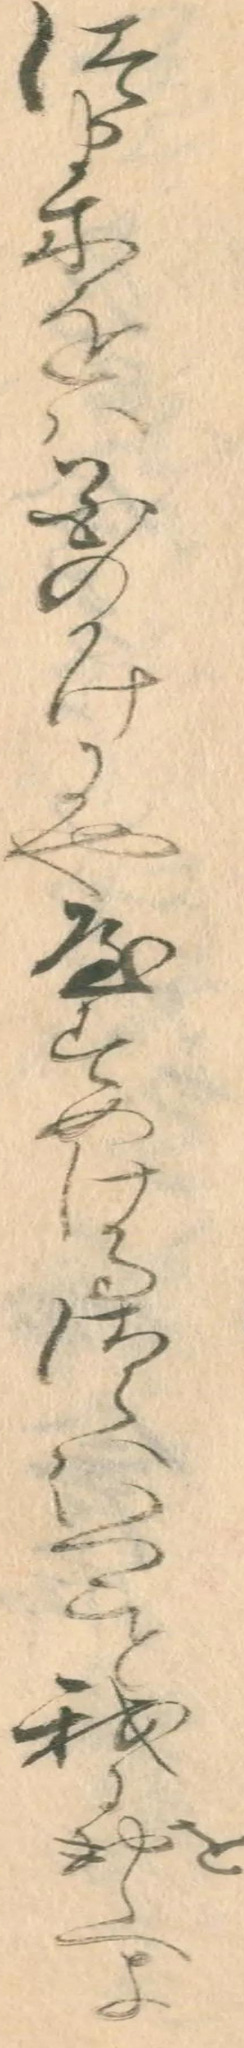つま木をは花のかけにややすめけるさらはいつこと我におをしへよ
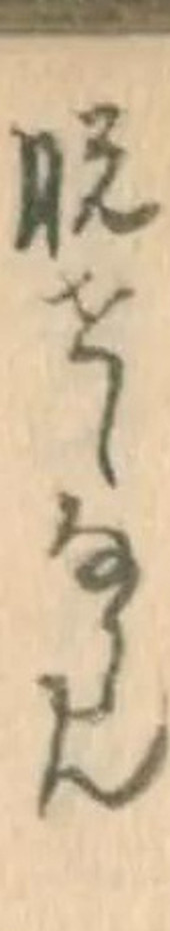脱せしならん
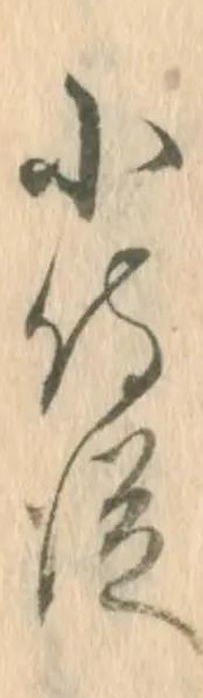小侍従
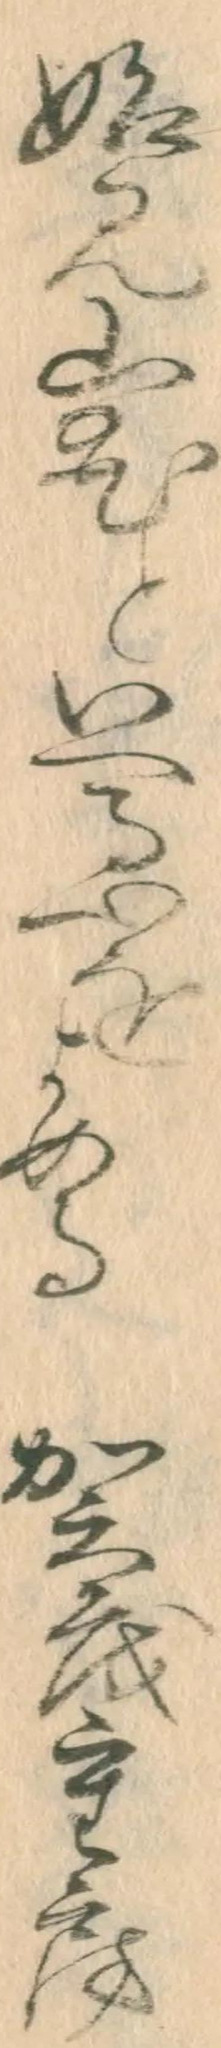始見山花といへる心をよめる賀茂重房
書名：月詣和歌集
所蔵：国立国会図書館 National Diet Library, JAPAN
